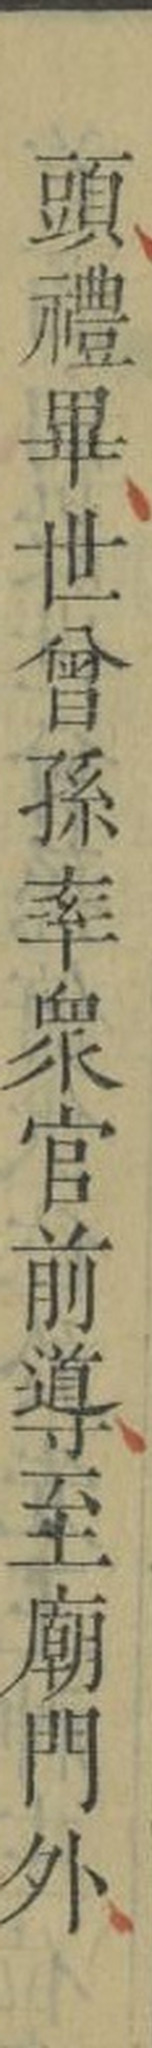頭禮畢世曾孫率衆官前導至廟門外
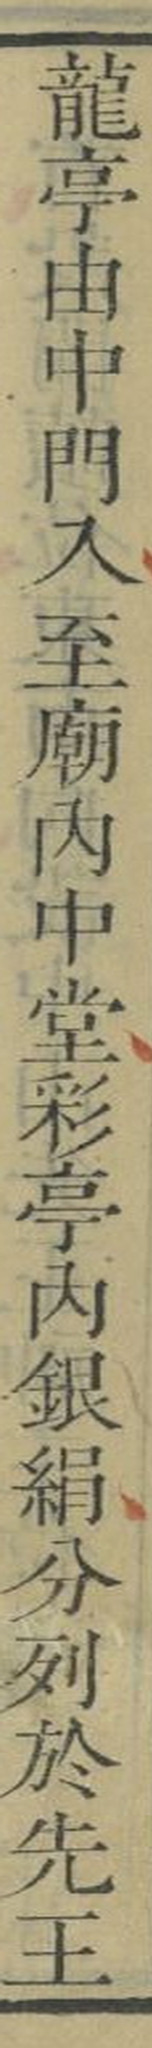龍亭由中門入至廟内中堂彩亭内銀絹分列於先王
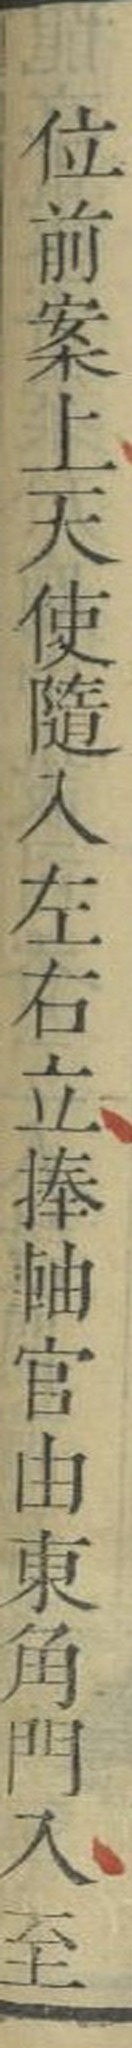位前案上天使隨入左右立捧軸官由東角門入至
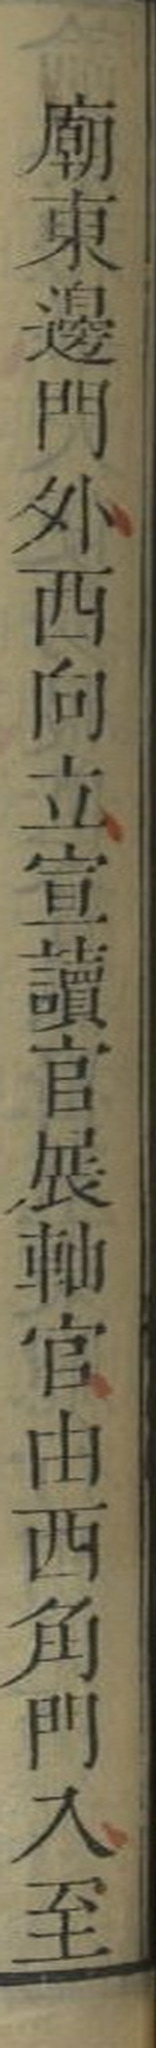廟東邊門外西向立宣讀官展軸官由西角門入至
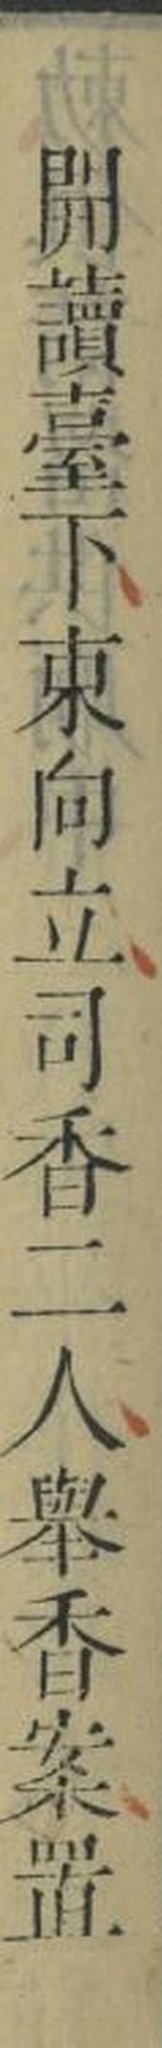開讀臺下東向立司香二人舉香案置
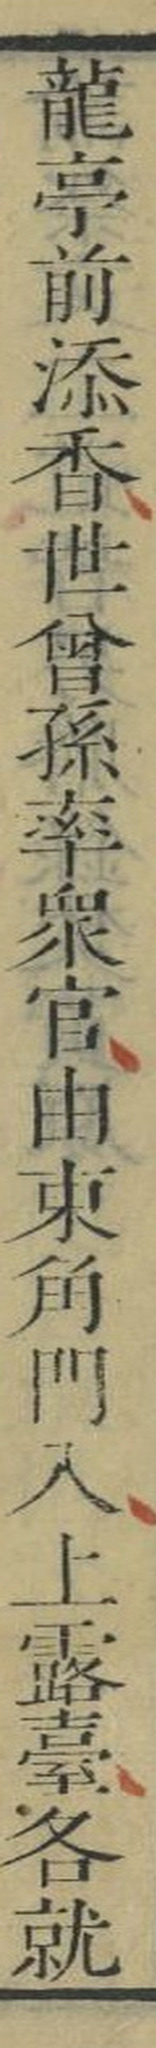龍亭前添香世曾孫率衆官由東角門入上露臺各就
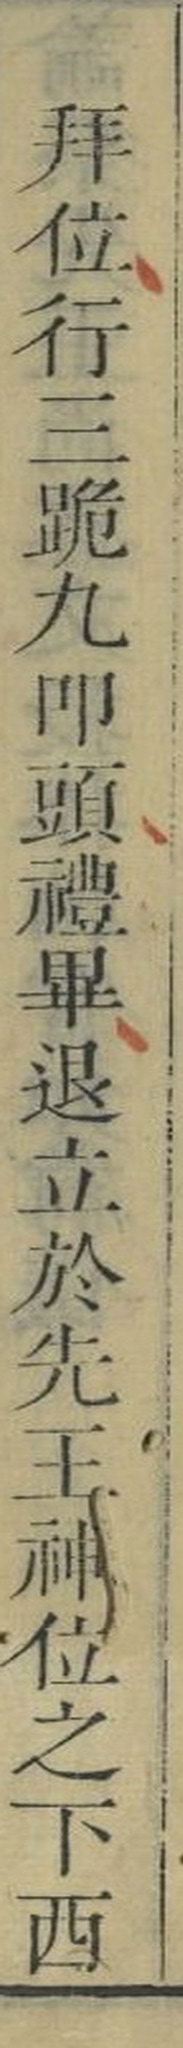拜位行三跪九叩頭禮畢退立於先王神位之下西
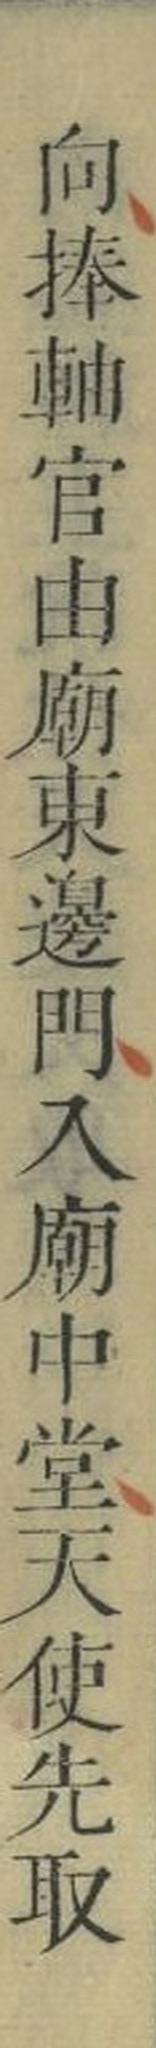向捧軸官由廟東邊門入廟中堂天使先取
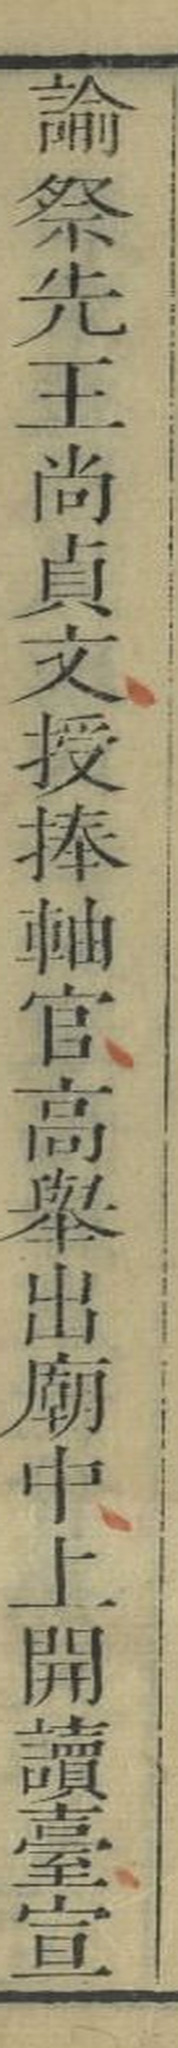諭祭先王尚貞文授捧軸官高舉出廟中上開讀臺宣
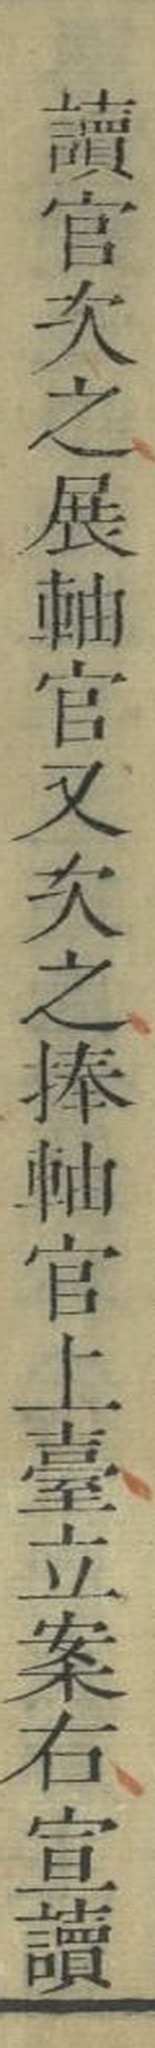讀官次之展軸官又次之捧軸官上臺立案右宣讀
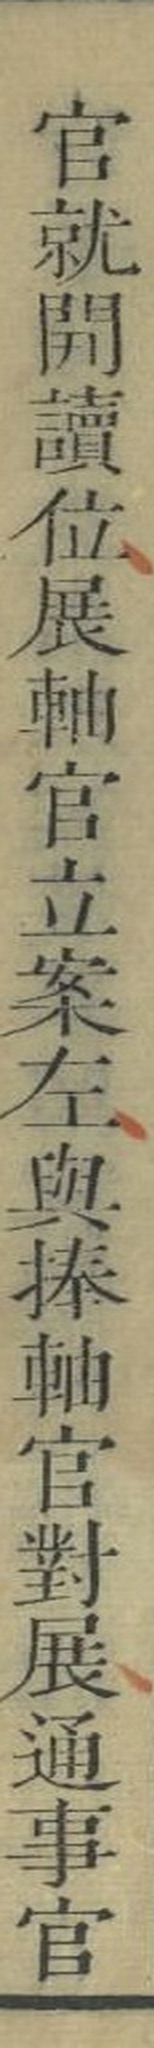官就開讀位展軸官立案左與捧軸官對展通事官
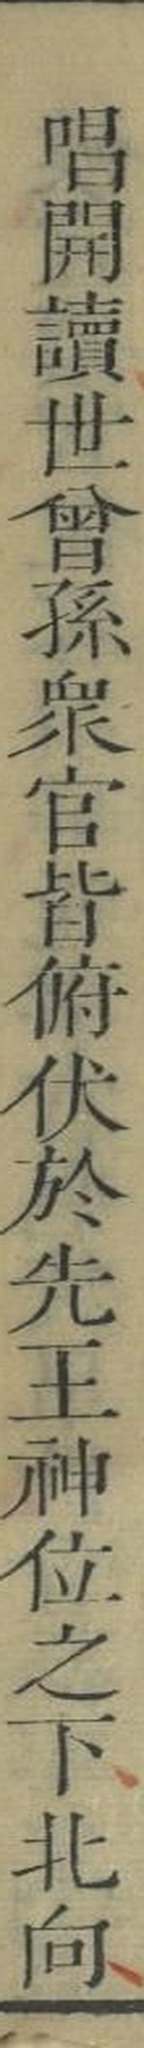唱開讀世曾孫衆官皆俯伏於先王神位之下北向

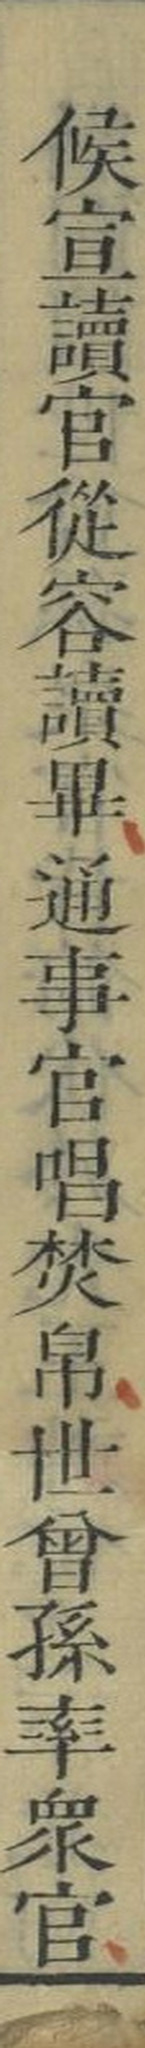候宣讀官從容讀畢通事官唱焚帛世曾孫率衆官
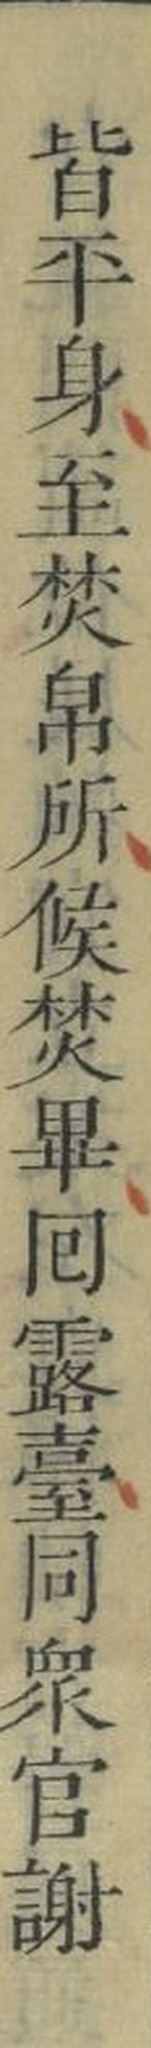皆平身至焚帛所候焚畢囘露臺同衆官謝
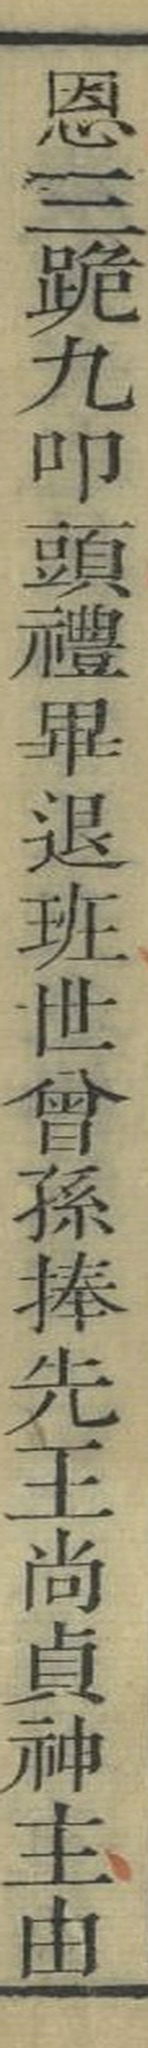恩三跪九叩頭禮畢退班世曾孫捧先王尚貞神主由
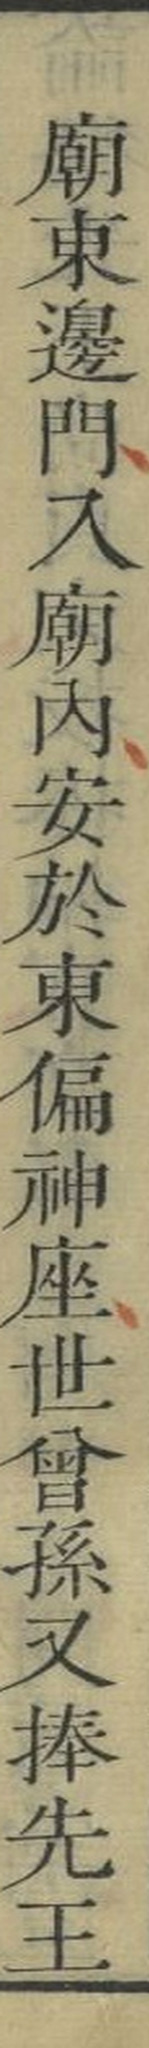廟東邊門入廟内安於東偏神座世曾孫又捧先王
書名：中山伝信録 巻一、巻二
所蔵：University of the Ryukyus Library
